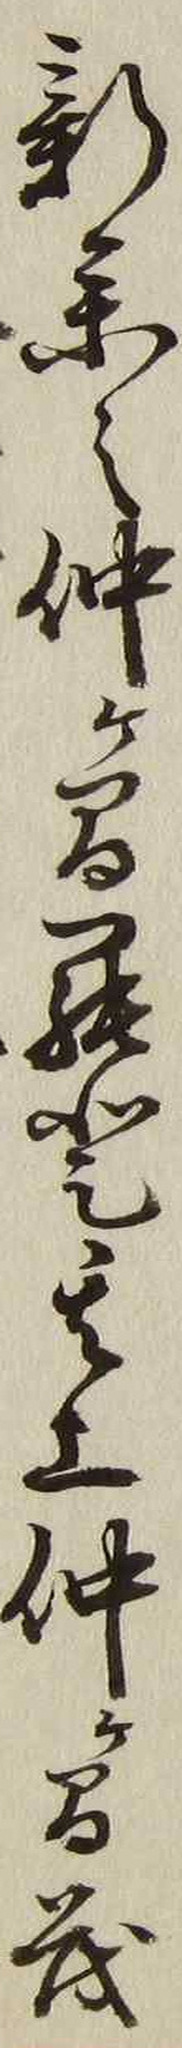新参之仲ケ間罷登其上仲ケ間茂
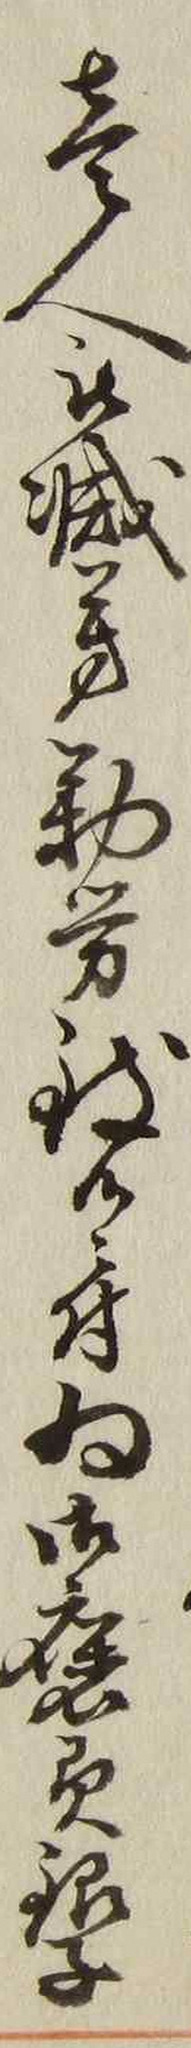壱人被減旁勤労致候ニ付為御褒美銀子
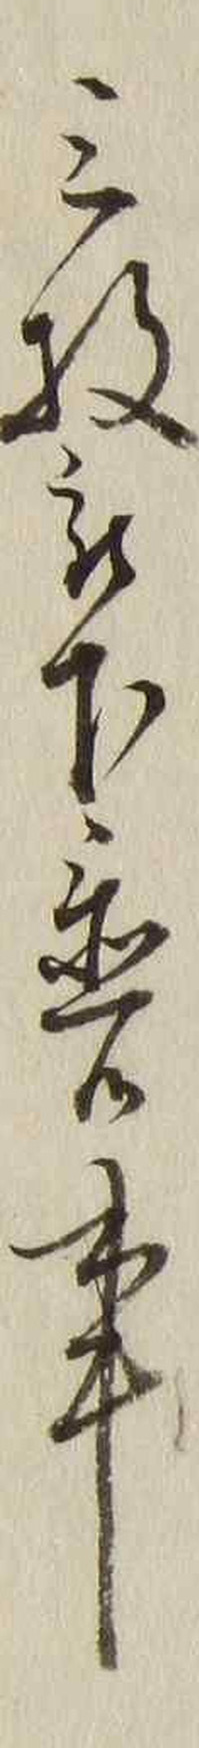三枚被下置候事

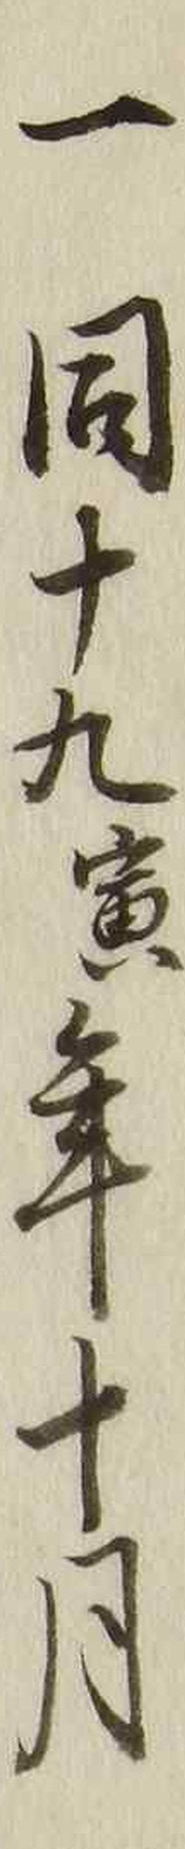一同十九寅年十月
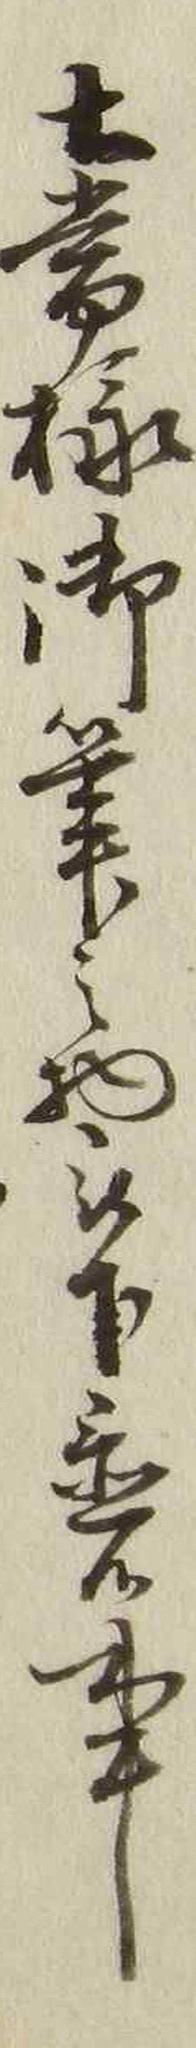土常様御筆之物被下置候事
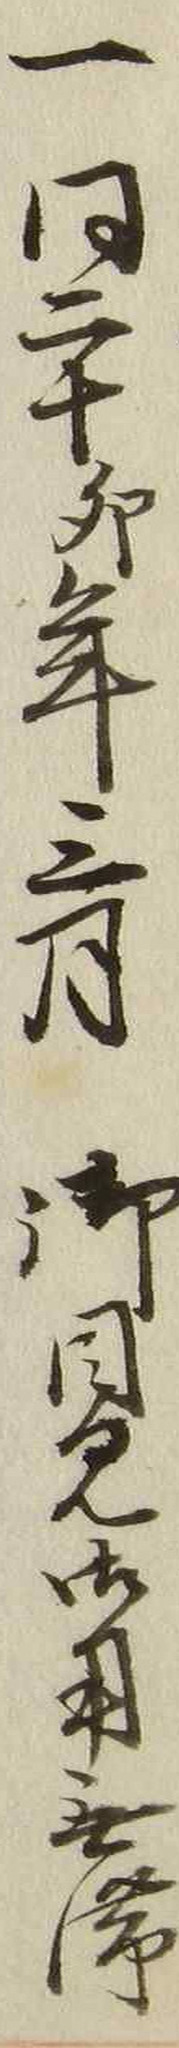一同二十卯年三月御目見御用無滞
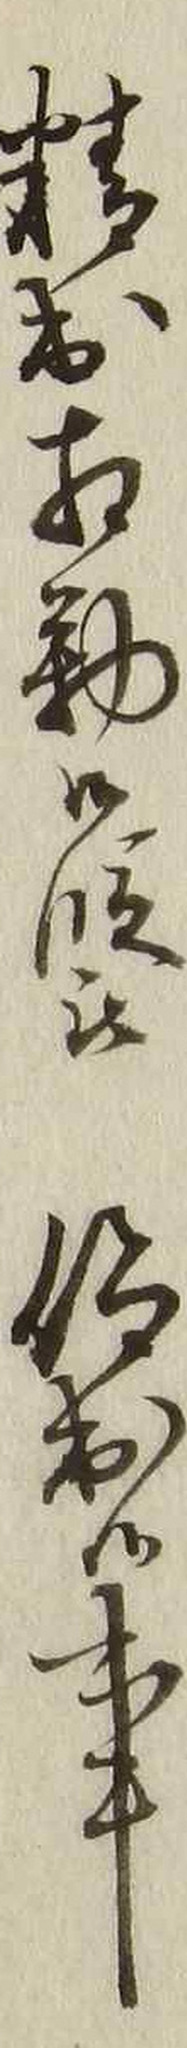精出相勤候段被仰出候事
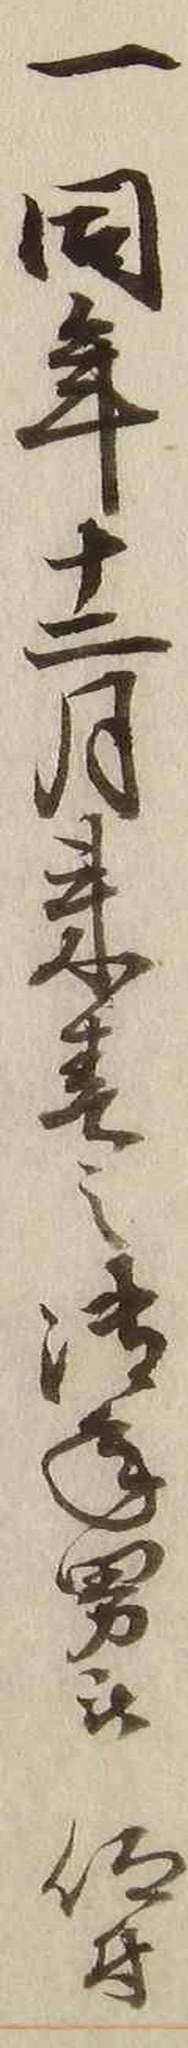一同年十二月来春之御年男被仰付
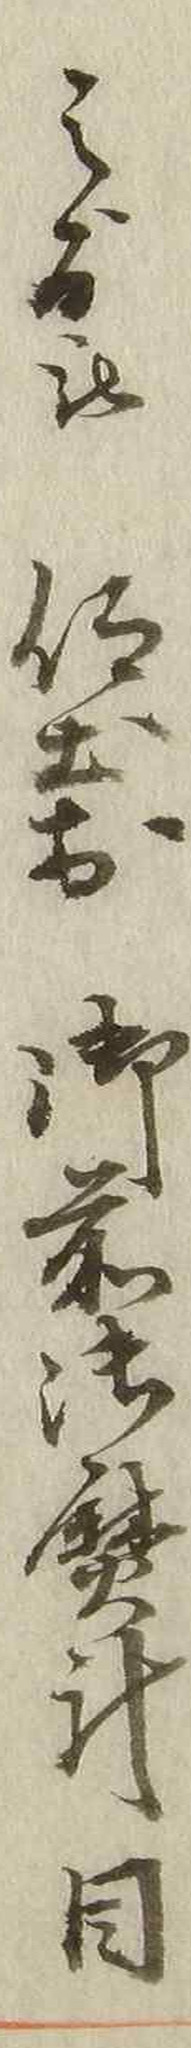之旨被仰出於御前御熨斗目
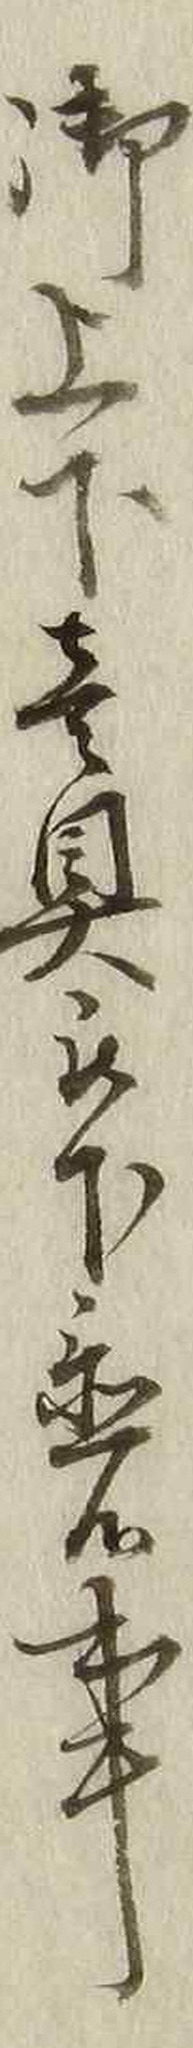御上下壱具被下置候事
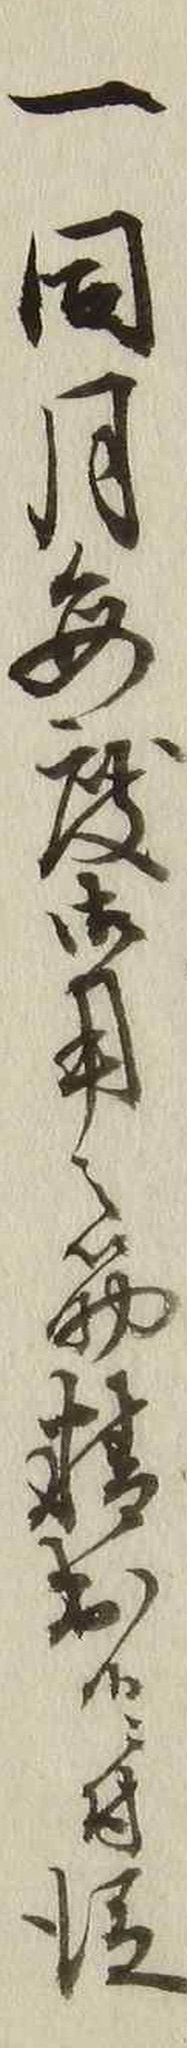一同月毎度御用之筋精出候ニ付従
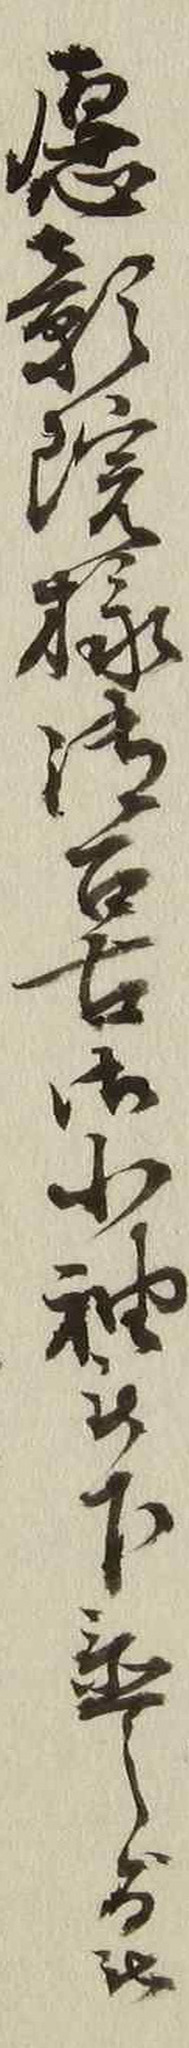愿影院様御召古御小袖被下置之旨被
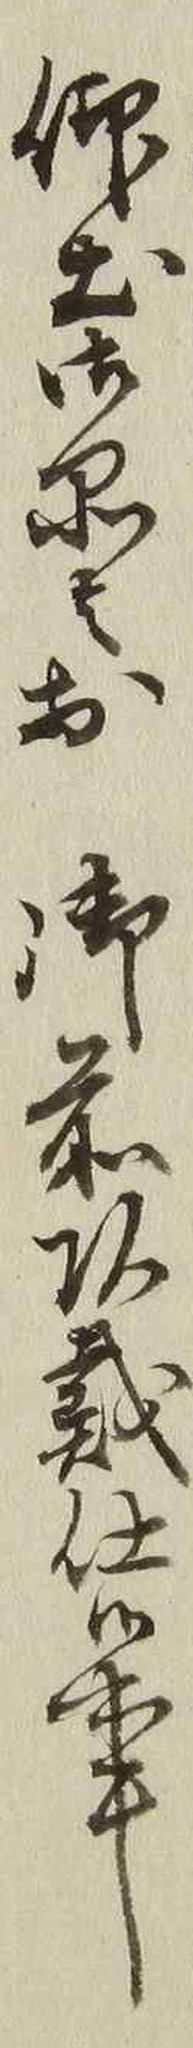仰出御品者於御前頂戴仕候事
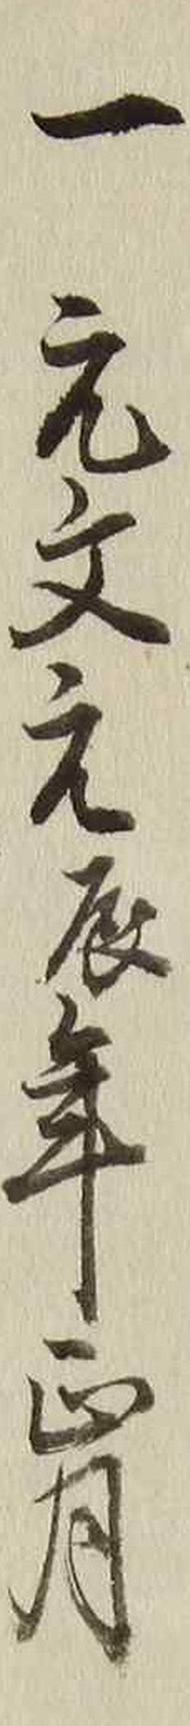一元文元辰年正月
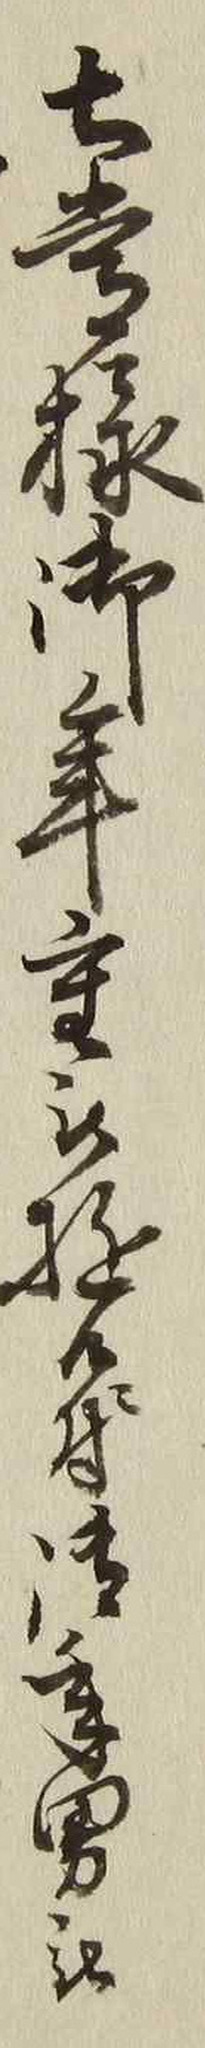土常様御年重被遊候ニ付御年男被
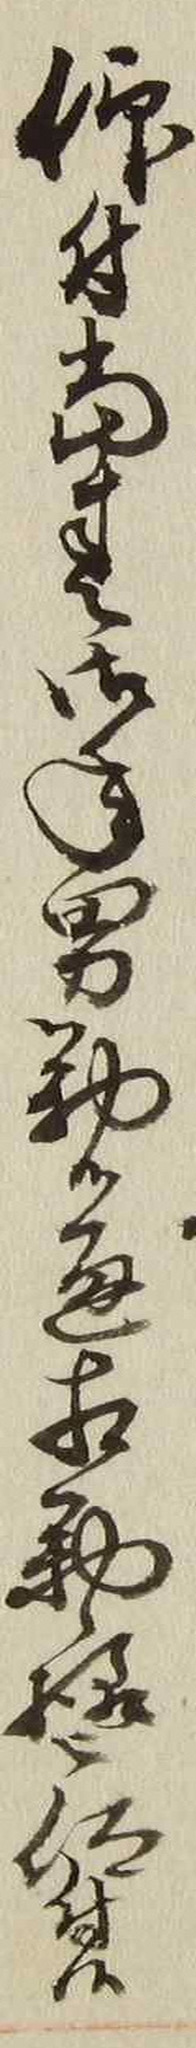仰付当春御年男勤候通相勤候様被仰付候
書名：諸士系譜　巻之23　い之部23
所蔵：会津若松市立会津図書館
